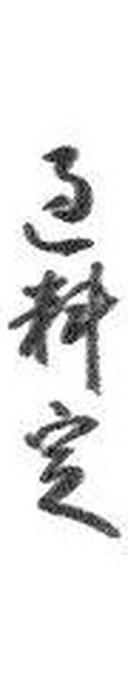過料定
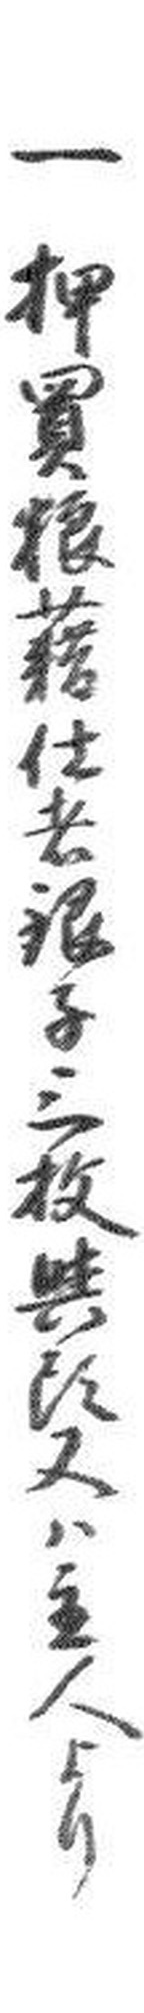一押買狼藉仕者銀子三枚與頭又ハ主人より
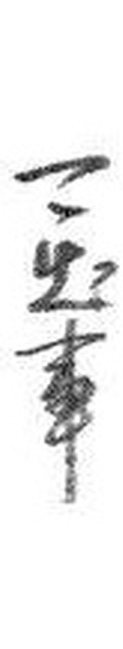可出事
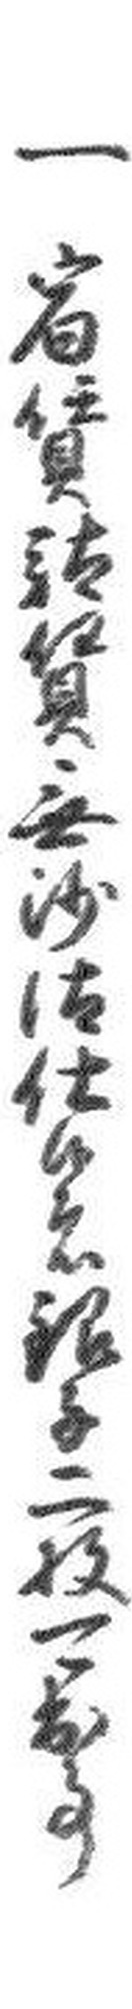一宿賃駄賃無沙汰仕候者銀子二枚可出事
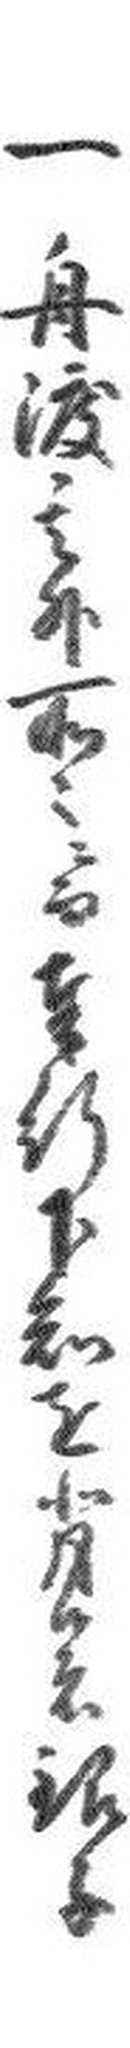一舟渡其外所々ニ而奉行下知を背候者銀子
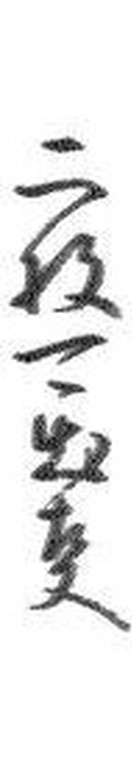二枚可出事
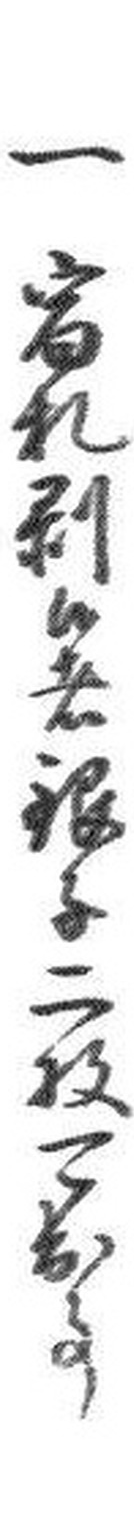一宿札剥候者銀子二枚可出事
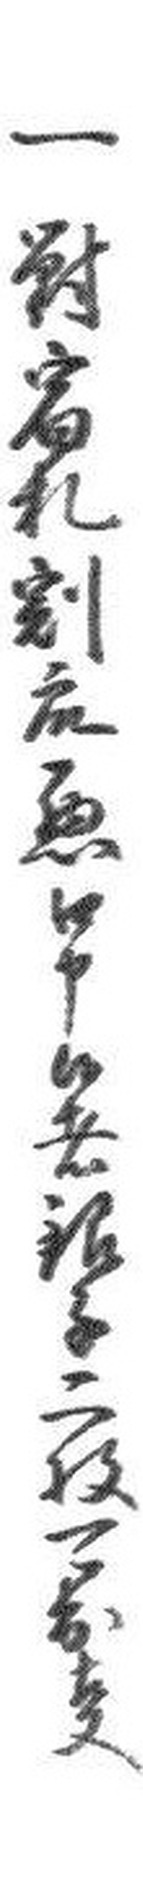一対宿札割衆悪口申候者銀子二枚可出事
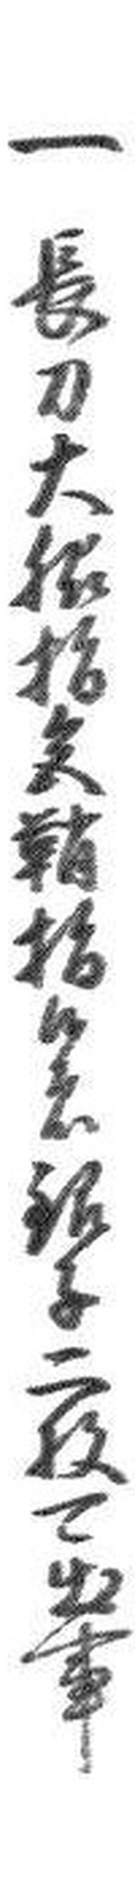一長刀大脇指色鞘指候者銀子二枚可出事

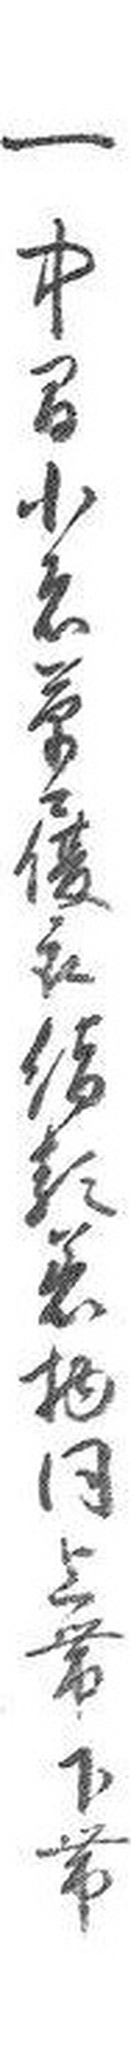一中間小者草履取絹類着物同上帯下帯
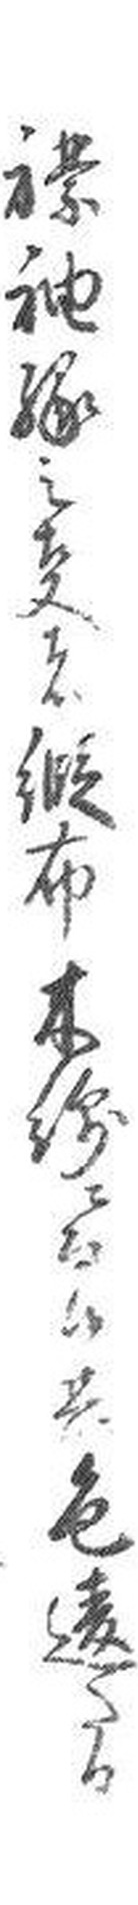襟袖縁之事は縦布木綿ニ而候共色違たる
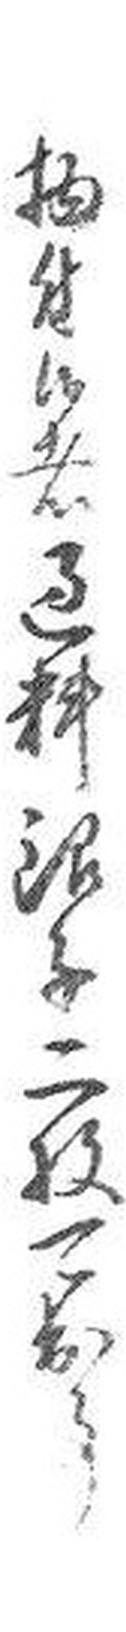物付候者過料銀子二枚可出事
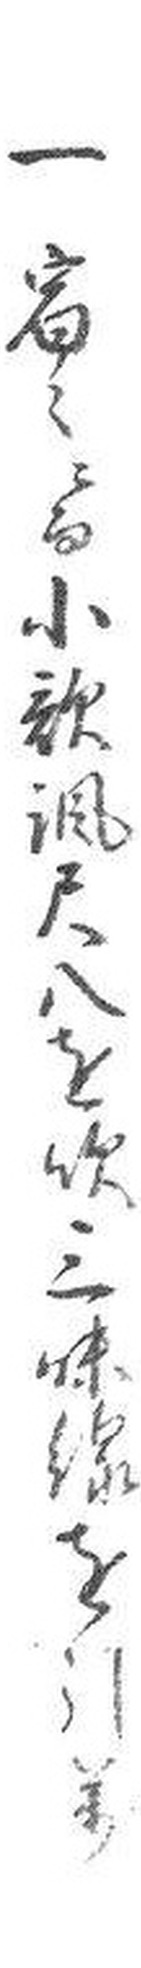一宿々ニ而小歌諷尺八を吹三味線を引万
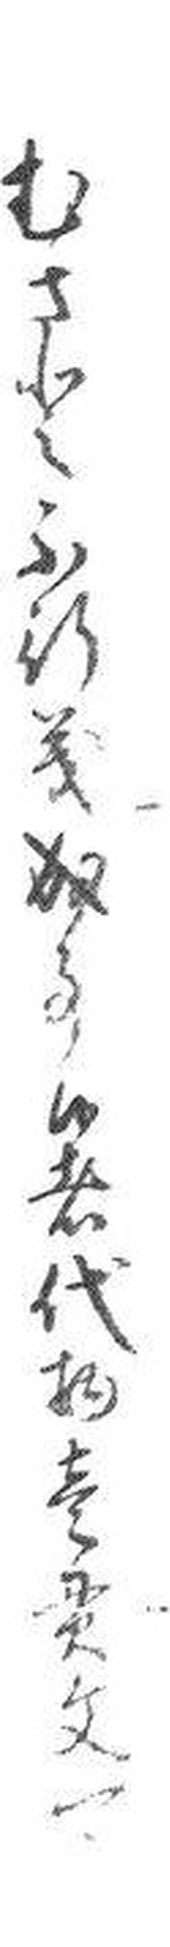むさと不行義成事候者代物壱貫文可
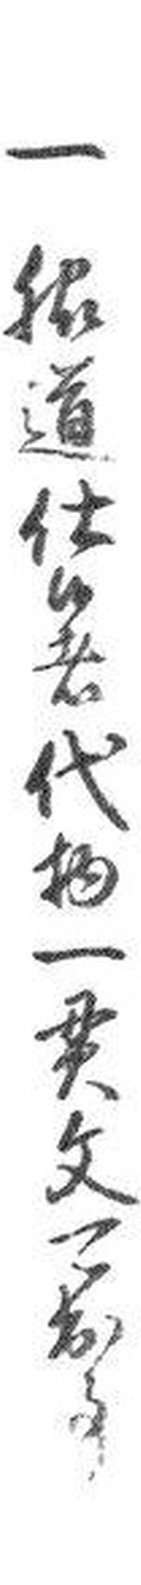一脇道仕候者代物壱貫文可出事
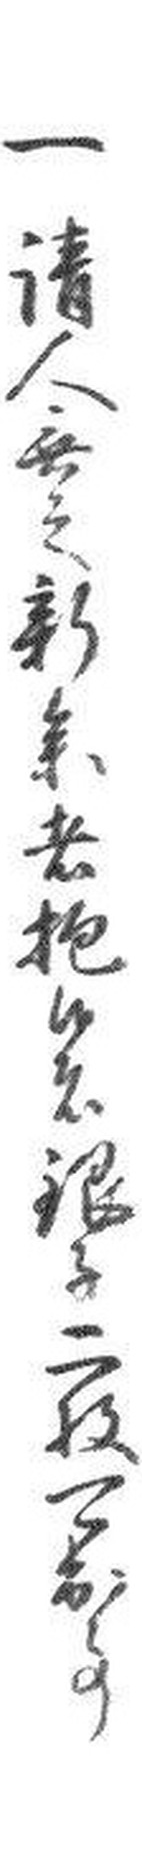一請人無之新参者抱候者銀子二枚可出事
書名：家譜 四 忠昌公 従寛永七年到正保四年
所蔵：福井県文書館 Fukui Prefectural Archives
